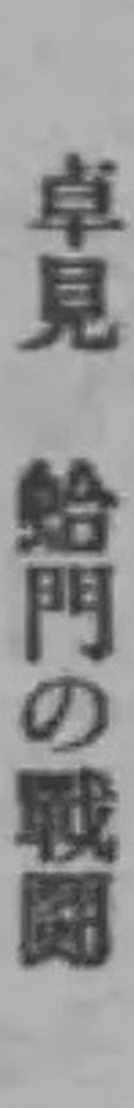卓見蛤門の戦闘
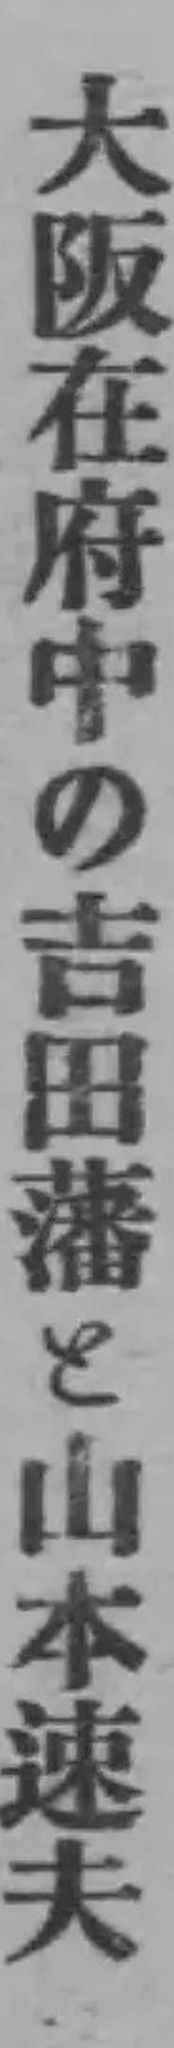大阪在府中の吉田藩と山本速夫
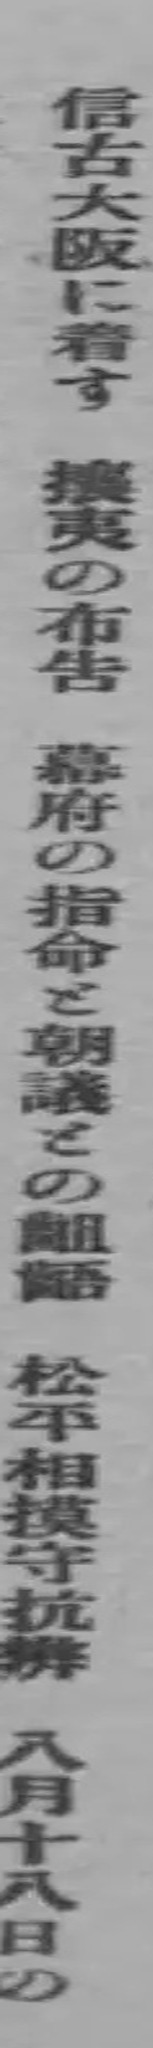信古大阪に着す攘夷の布告幕府の指命と朝議との齟齬松平相模守抗弁八月十八日の
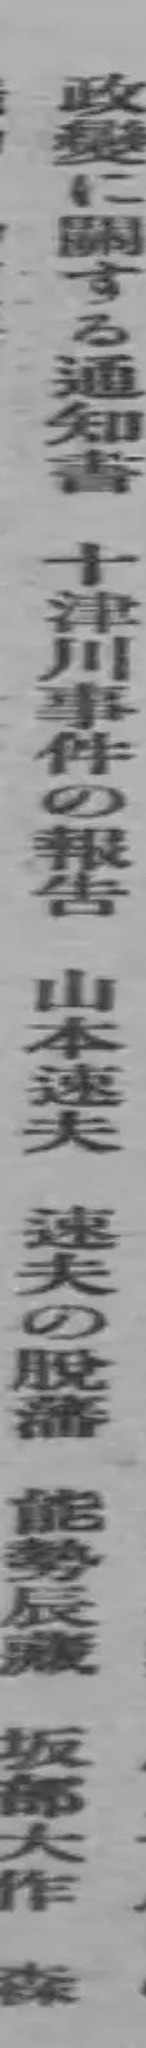政変に関する通知書十津川事件の報告山本速夫速男の脱藩能勢辰蔵坂部大作森
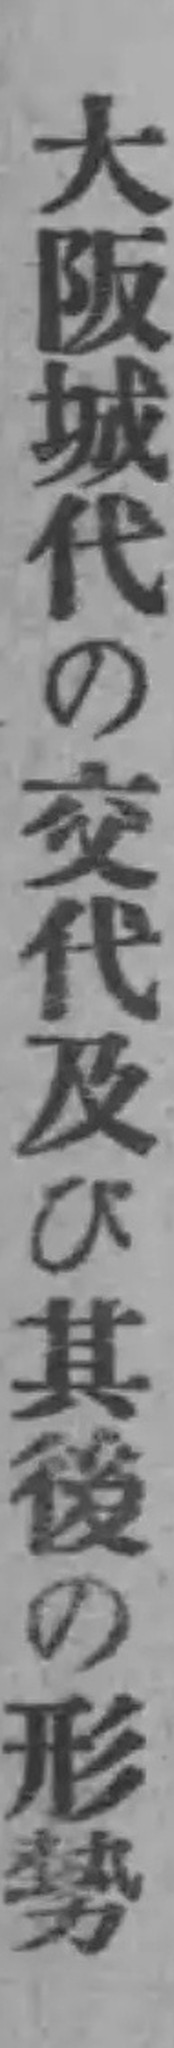大阪坂城代の交代及び其後の形勢

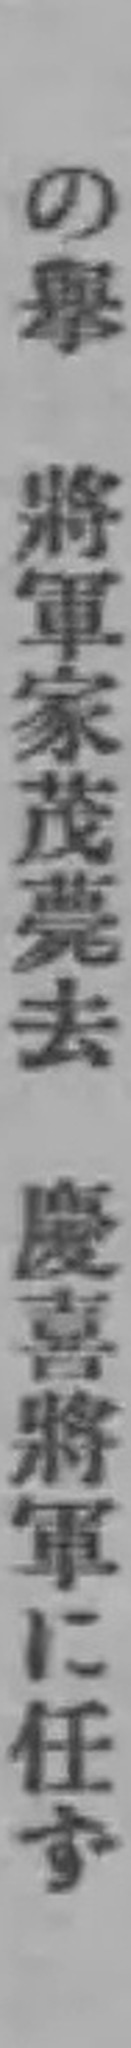の挙将軍家茂薨去慶喜将軍に任ず
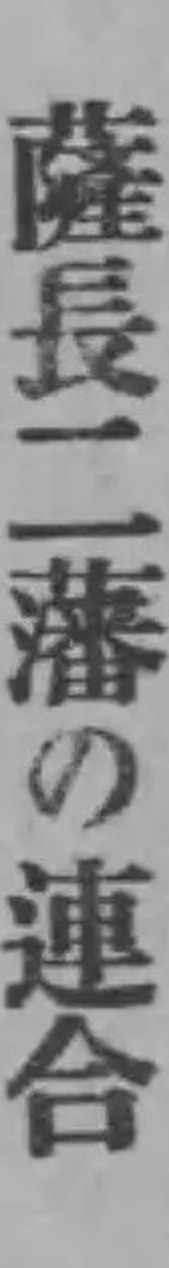薩長二藩の連合
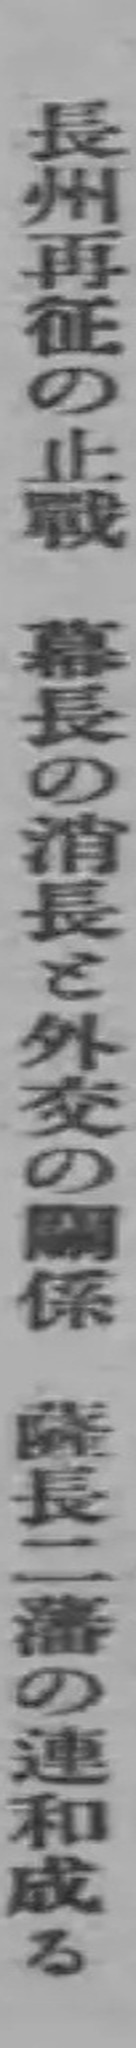長州再征の止戦幕長の消長と外交の関係薩長二藩の連和成る
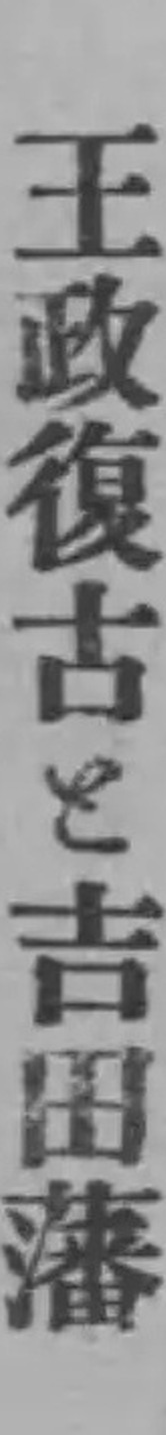王政復古と吉田藩
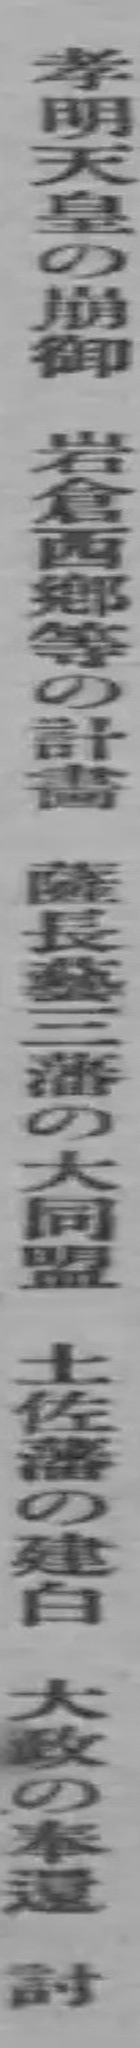孝明天皇の崩御岩倉西郷等の計画薩長芸三藩の大同盟土佐藩の建白大政の奉還討
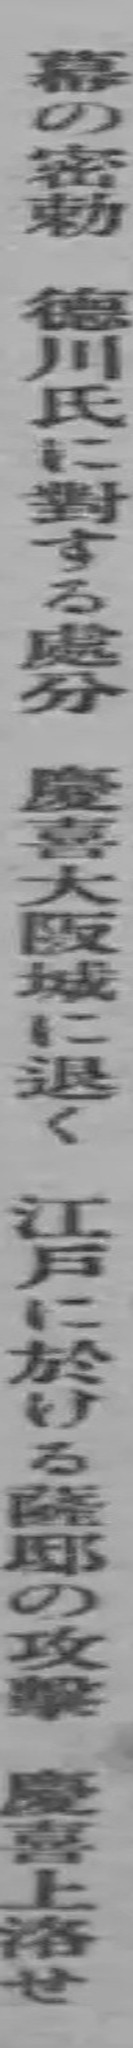幕の密勅徳川氏に対する処分慶喜大阪城に退く江戸に於ける薩邸の攻撃慶喜上洛せ
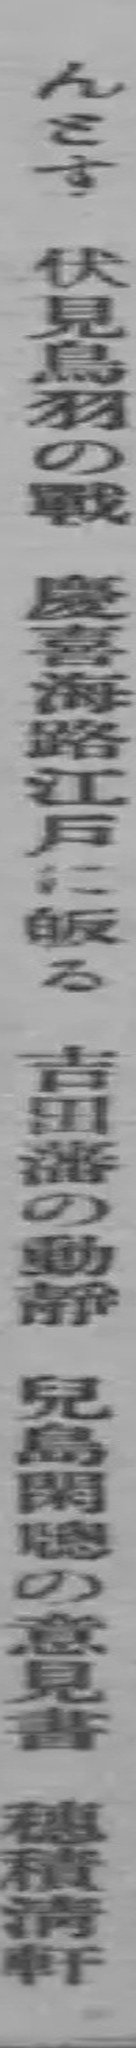んとす伏見鳥羽の戦慶喜海路江戸に皈る吉田藩の動静児島閑牕の意見書穂積清軒
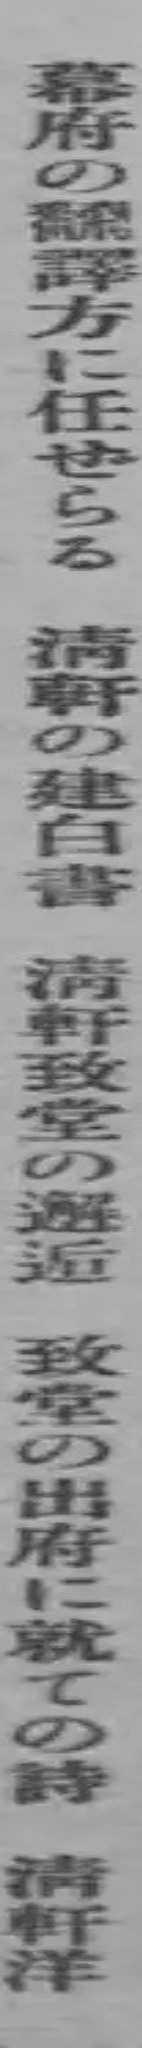幕府の翻訳方に任ぜらる清軒の建白書清軒致堂の邂逅致堂の出府に就ての詩清軒洋
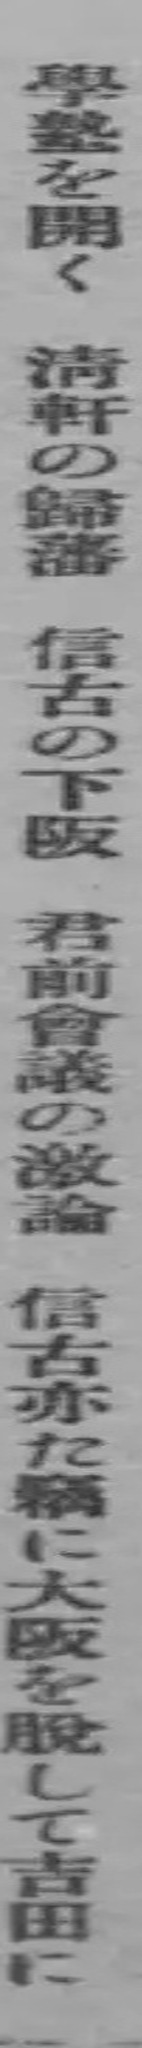学塾を開く清軒の帰藩信古の下阪君前会議の激論信古亦た竊に大阪を脱して吉田に
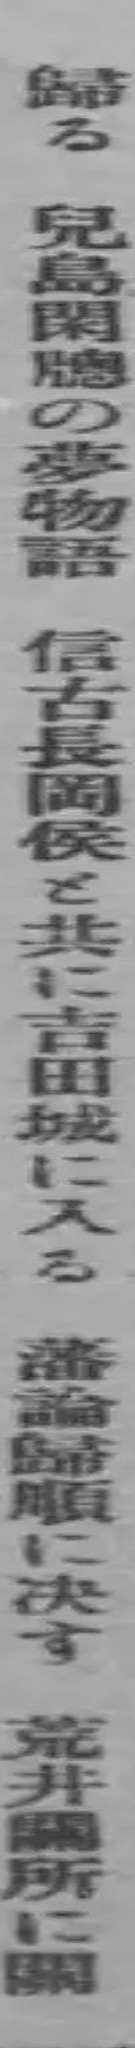帰る児島閑牕の夢物語信古長岡侯と共に吉田城に入る藩論帰順に決す荒井関所に関
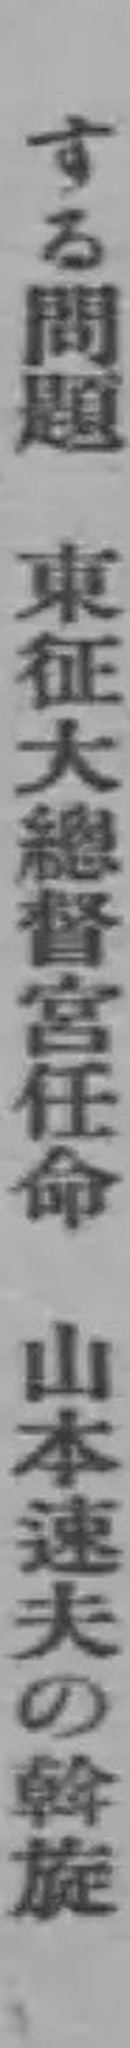する問題東征大総督宮任命山本速夫の斡旋
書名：豊橋市史談
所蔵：国立国会図書館 National Diet Library, JAPAN
